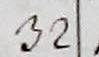32
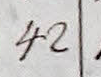42
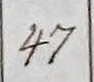47
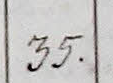35.
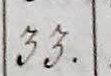33.
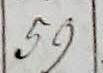59
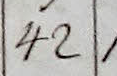42
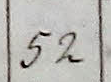52
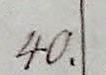40.
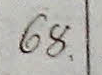68.
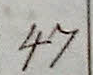47
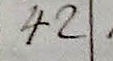42
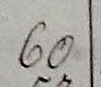60
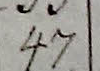47
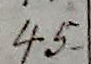45
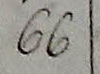66
